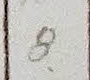8
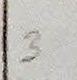3
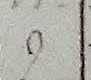9
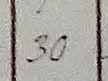30
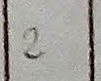2
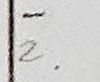2
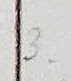3
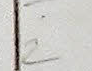2
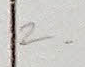2
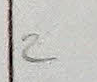2
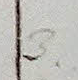3
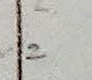2
